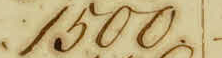1500.
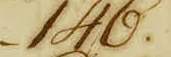146.
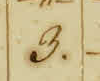3.
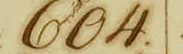604.
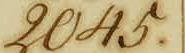2045.
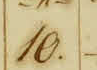10.
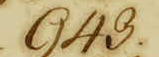943.
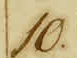10.
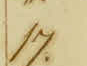17.
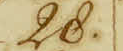28.
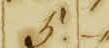5.
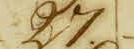27.
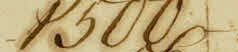1500
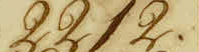2212.
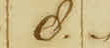8.
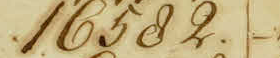16582.
